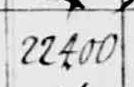22400
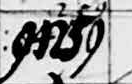94259
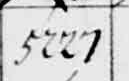5227
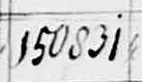150831
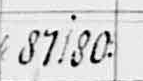87180:
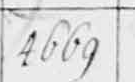4669
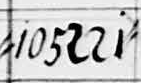105221
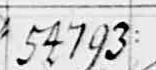54793
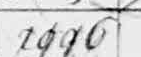1996
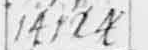14124
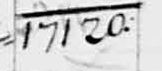17120:
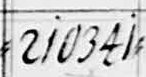210341
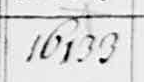16133
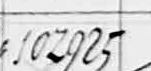102925
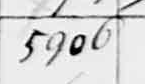5906
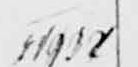11932
